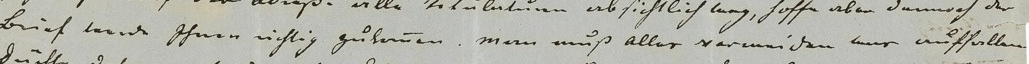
Brief werde Ihnen richtig zukommen. Man muß Alles vermeiden was auffallen
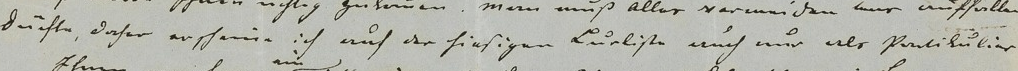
dürfte, daher erscheine ich auf der hiesigen Curliste auch nur als Partikulier.
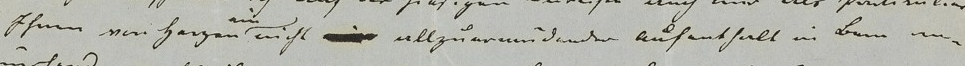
Ihnen von Herzen ein ... nicht allzuermüdender Aufenthalt in Bern an-
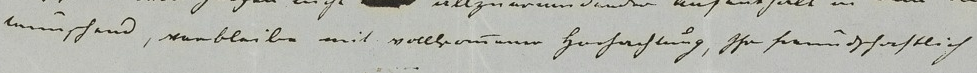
wünschend, verbleibe mit vollkommener Hochachtung, Ihr freundschaftlich
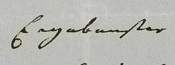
Ergebenster
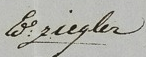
Ed: Ziegler
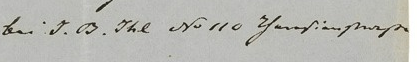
bei: I. B. JhlNo 110 Theresienstrasse
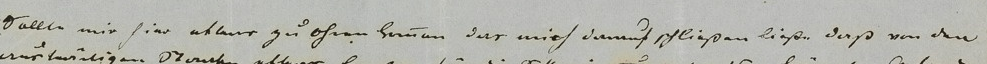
Sollte mir hier etwas zu Ohren kommen das mich darauf schließen ließe daß von den
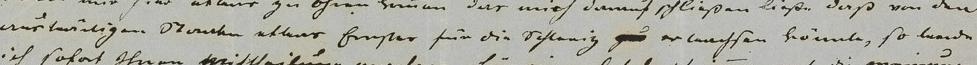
auswärtigen Staaten etwas Ernstes für die Schweiz erwachsen könnte, so werde
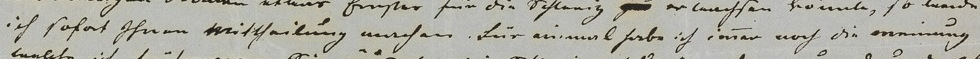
ich sofort Ihnen Mittheilung machen. Für einmal habe ich immer noch die Meinung
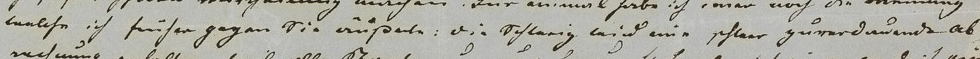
welche ich früher gegen sie äußerte: die Schweiz werde eine schwer zuverdauende Ab-
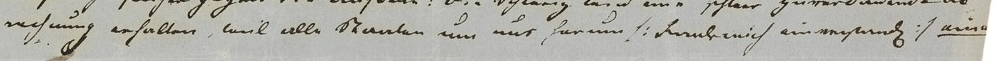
rechnung erhalten, weil alle Staaten um uns herum (Frankreich einverstanden) einer
